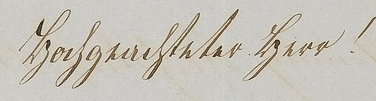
Hochgeachteter Herr!
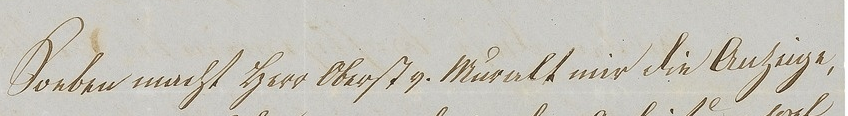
Soeben macht Herr Oberst v. Muralt mir die Anzeige,
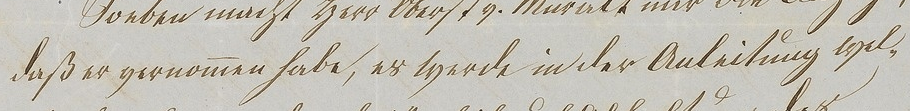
daß er vernommen habe, es werde in der Anleitung wel-
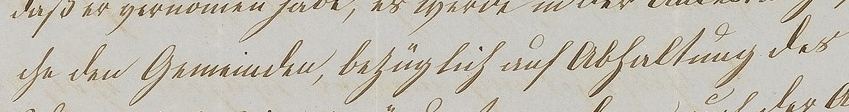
che den Gemeinden, bezüglich auf Abhaltung des
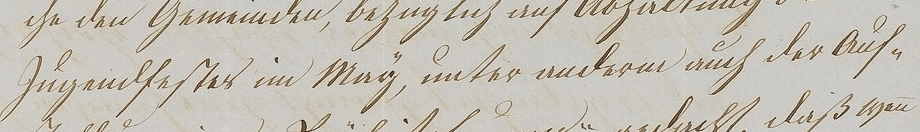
Jugendfestes im May, unter anderm auch der Auf-
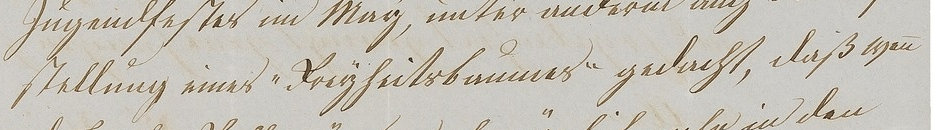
stellung eines «Freyheitsbaumes» gedacht, daß wenn
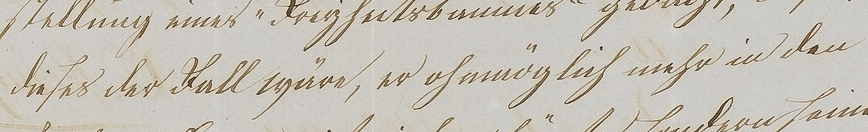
dieses der Fall wäre, er ohnmöglich mehr in den
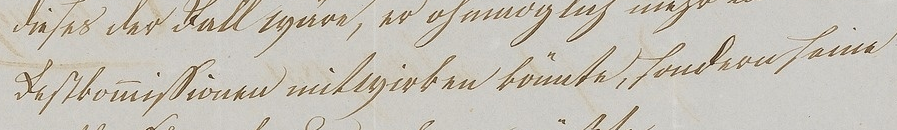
Festkommissionen mitwirken könnte, sondern seine
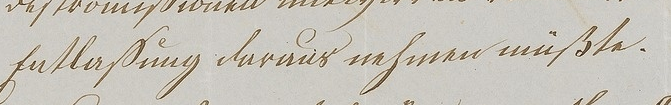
Entlassung daraus nehmen müßte.
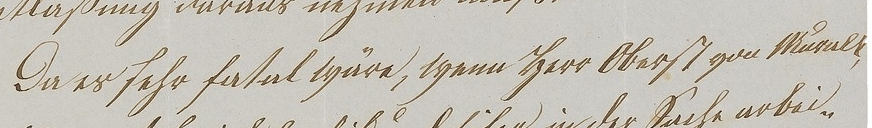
Da es sehr fatal wäre, wenn Herr Oberst von Muralt,
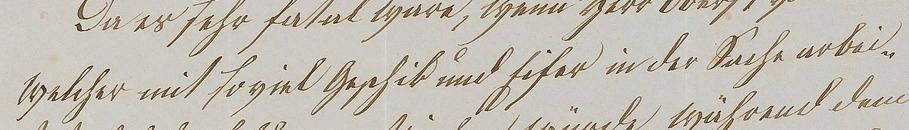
welcher mit so viel Geschik und Eifer in der Sache arbeitet,
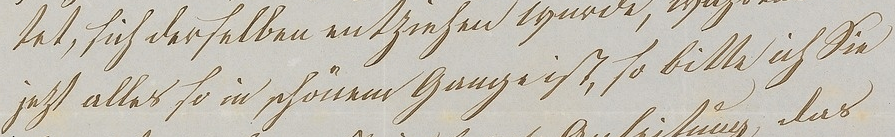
jezt alles so in schönem Gange ist, so bitte ich Sie
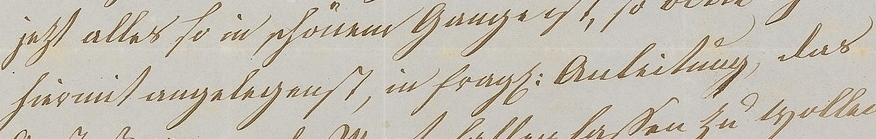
hiermit angelegenst, in fragl: Anleitung, das
